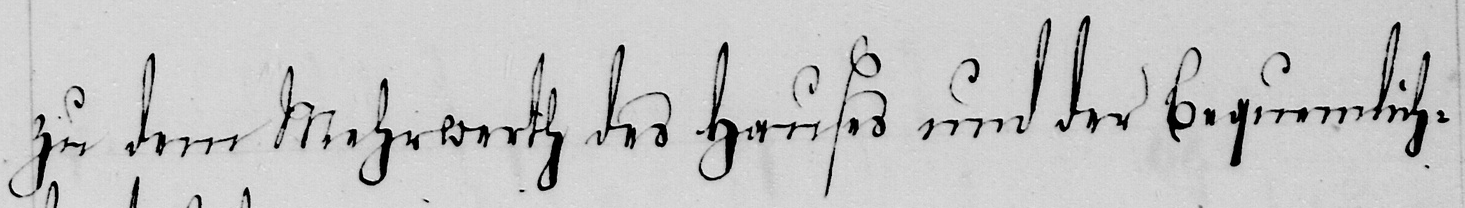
zu dem Mehrwerth des Hauses und der Bequemlich¬
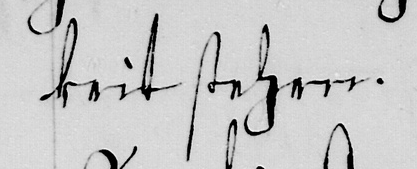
keit stehen.
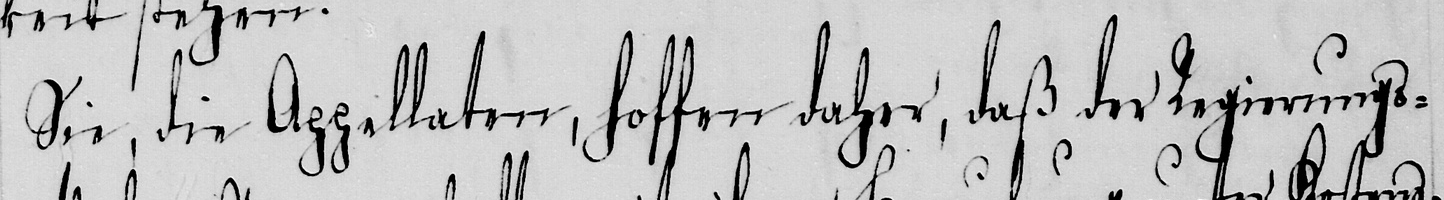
die Appellaten, hoffen daher, daß der Regierungs¬
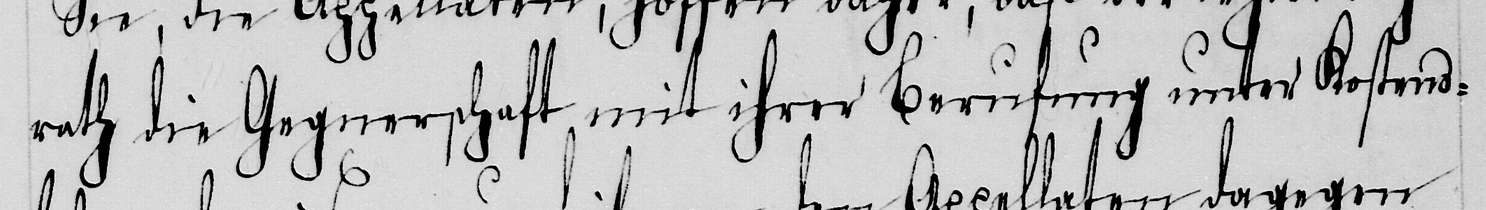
rath die Gegnerschaft mit ihrer Berufung unter Kostens¬
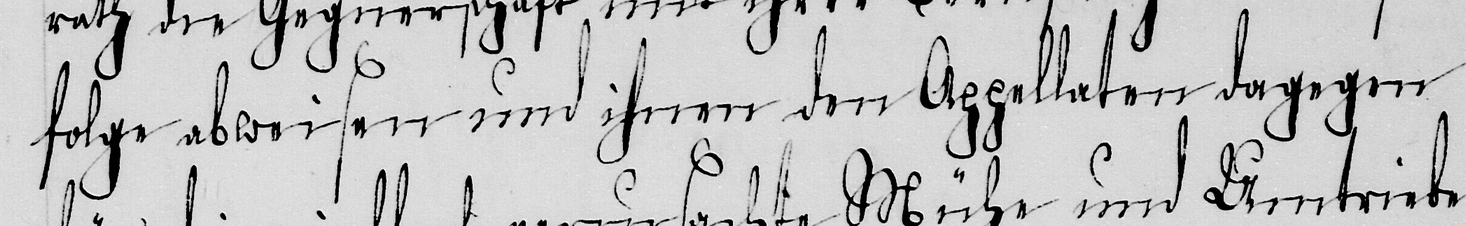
folge abweisen und ihnen den Appellaten dagegen
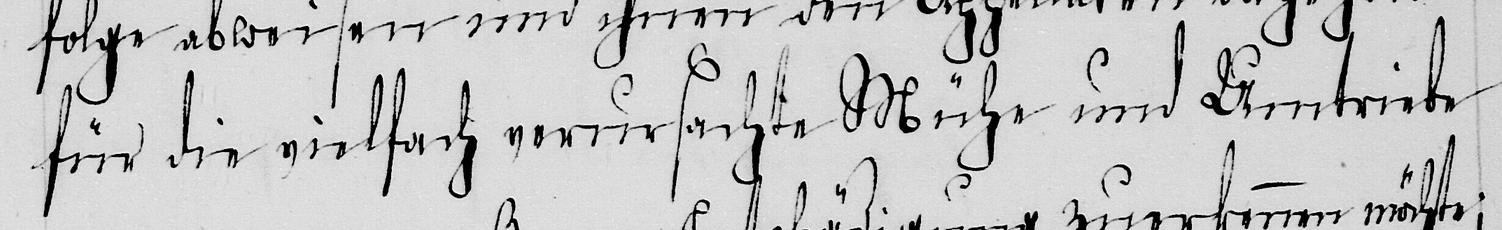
für die vielfach verursachte Mühe und Umtriebe
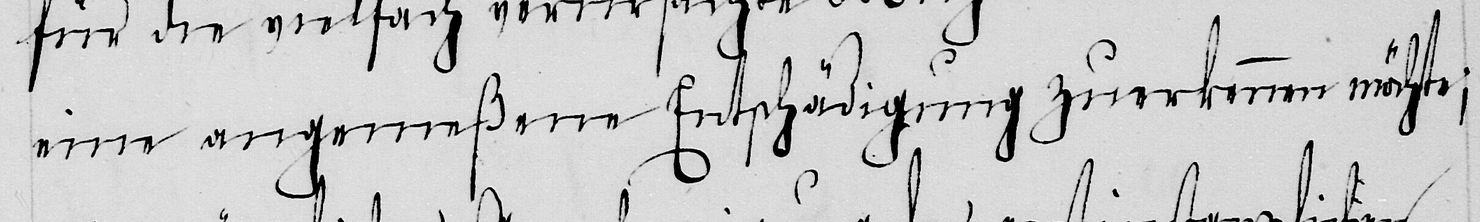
eine angemeßene Entschädigung zuerkennen möchte;
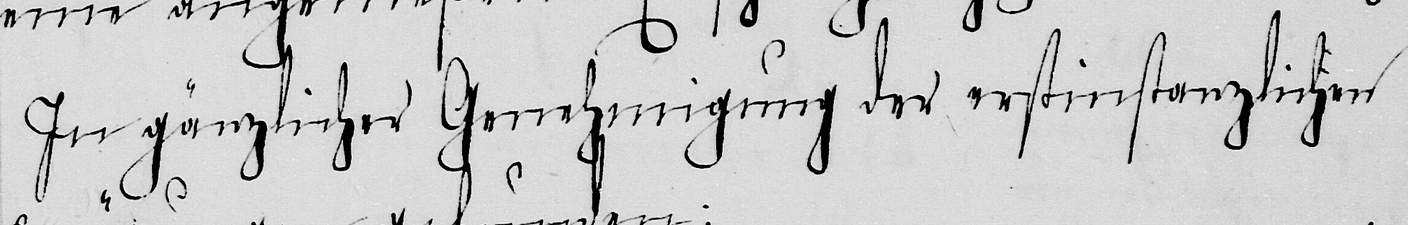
In gänzlicher Genehmigung der erstinstanzlichen
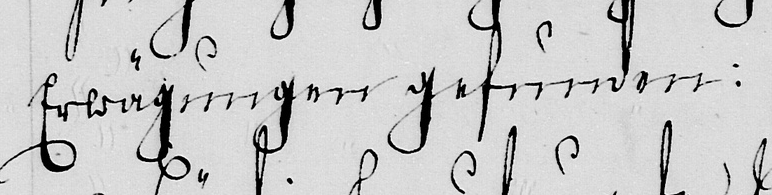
Erwägungen gefunden:
